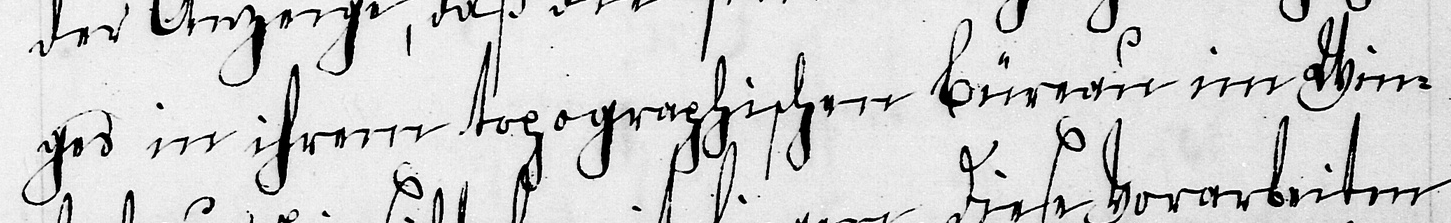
ges in ihrem topographischen Büreau im Win¬
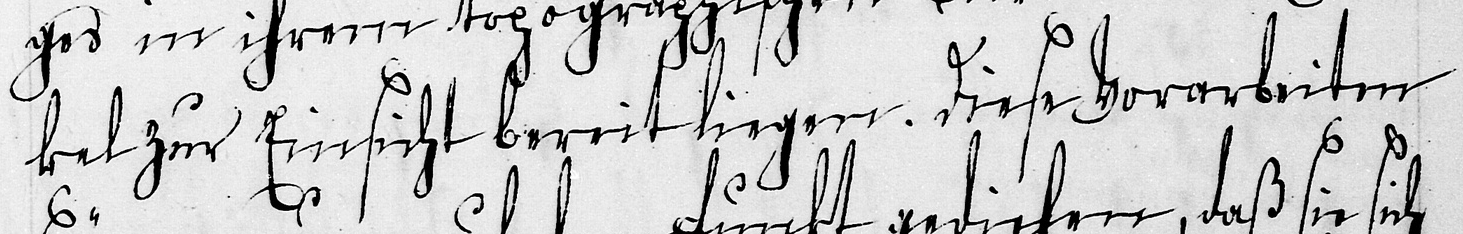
kel zur Einsicht bereit liegen. Diese Vorarbeiten
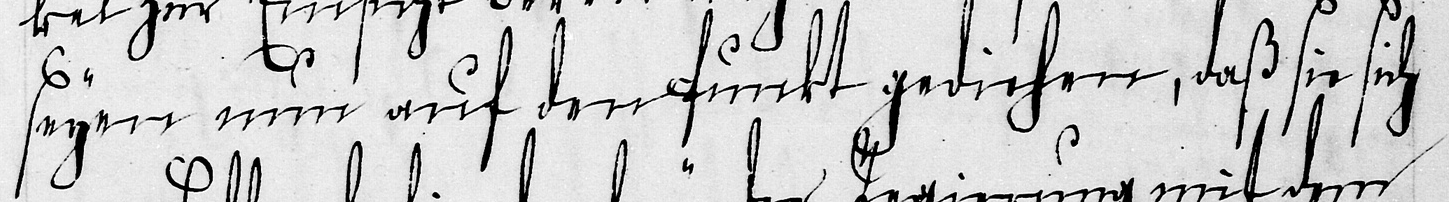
seyen nun auf den Punkt gediehen, daß sie sich
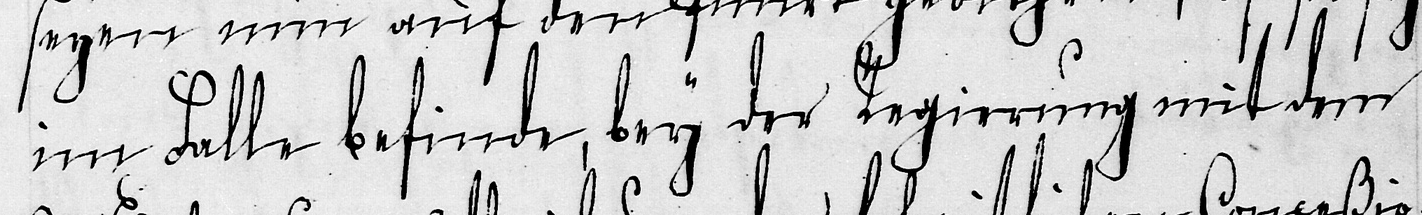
im Falle befinde, bey der Regierung mit dem
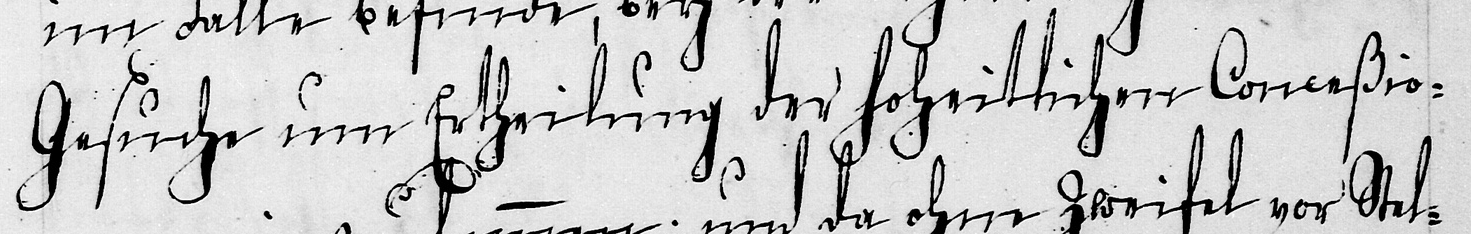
Gesuche um Ertheilung der hoheitlichen Conceßio¬
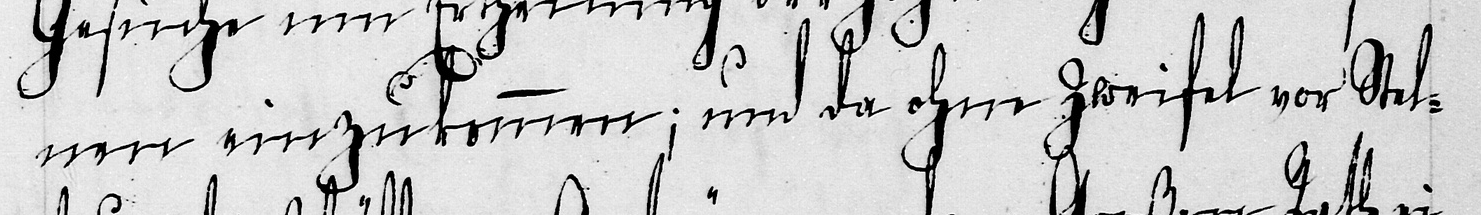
nen einzukommen; und da ohne Zweifel vor Stel¬
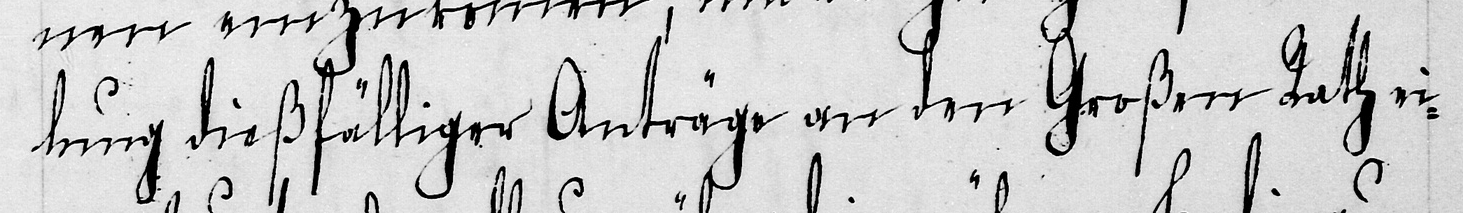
lung dießfälliger Anträge an den Großen Rath ei¬
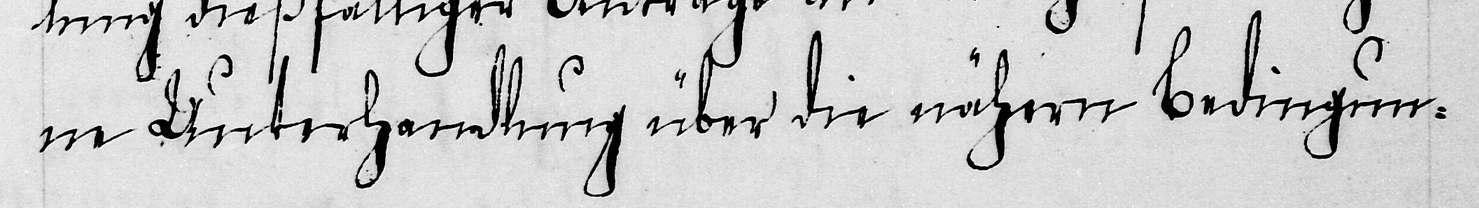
ne Unterhandlung über die nähern Bedingun-
